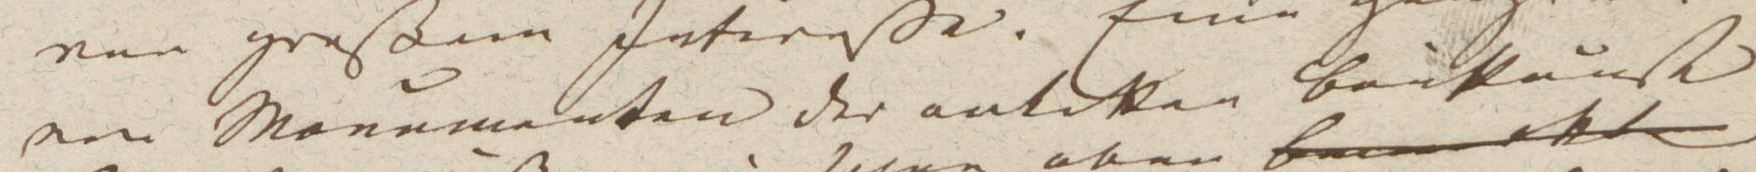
von Monumenten der antiken Baukunst
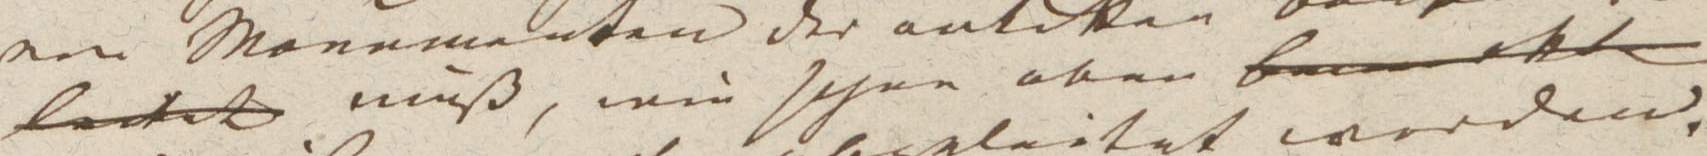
leitet muss, wie schon oben bemerkt
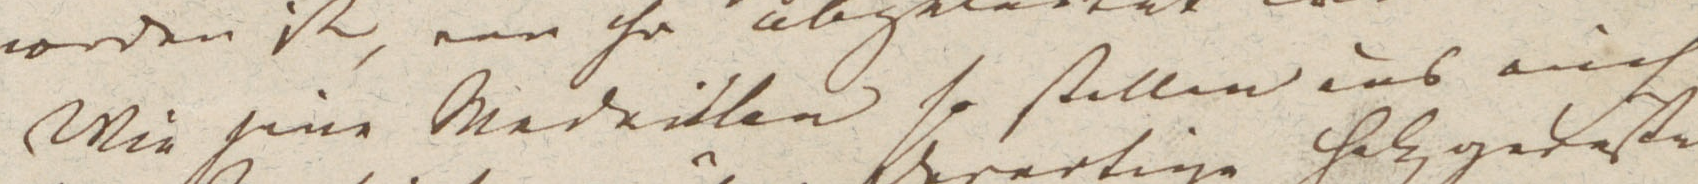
Wie jene Medaillen so stellen uns auch
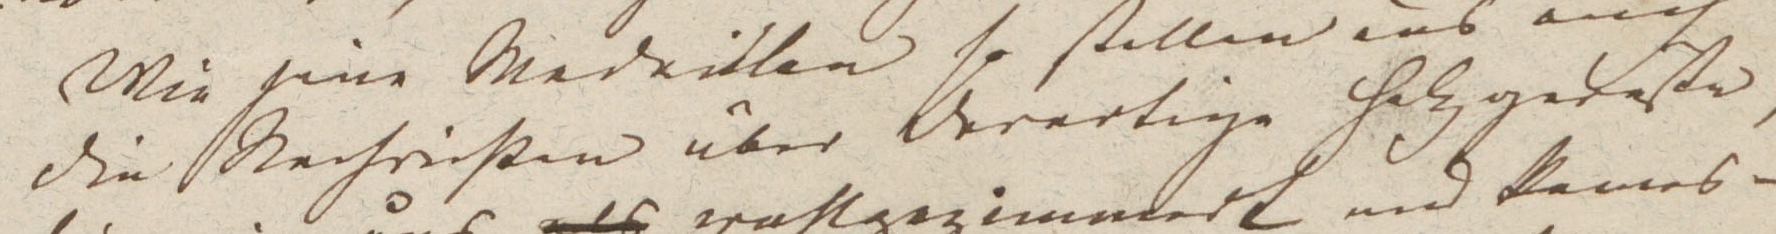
die Nachrichten über deratige Holzgerüste,
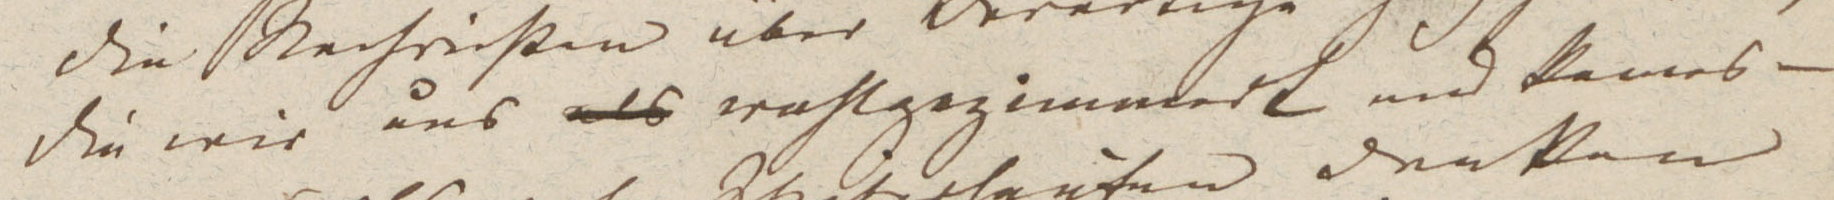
die wir uns als wohlgezimmert und keines-
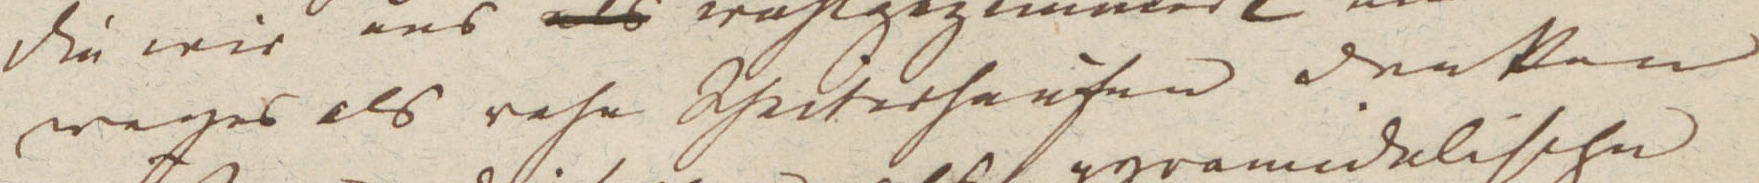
weges als rohe Scheiterhaufen denken
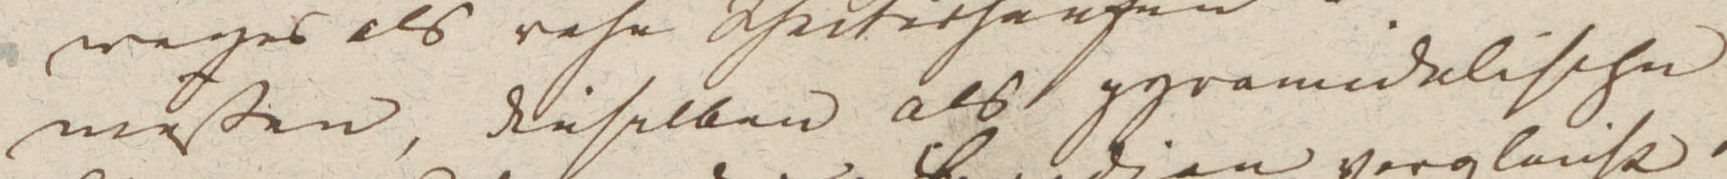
müssen, dieselben als pyramidalische
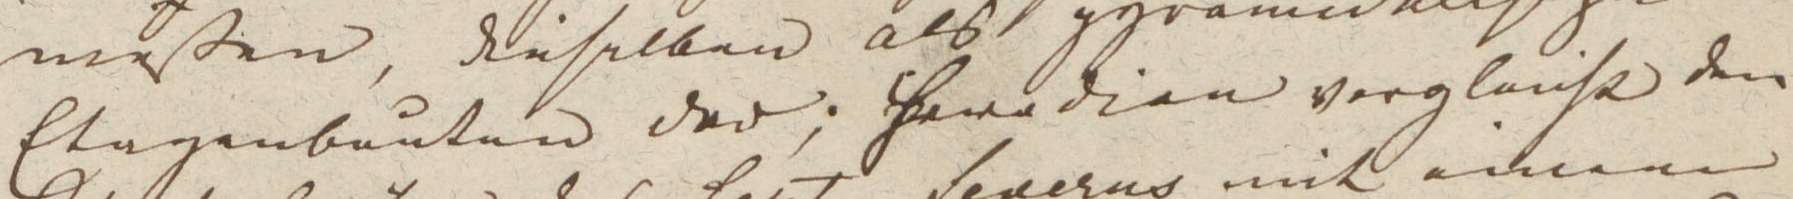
Etagenbauten dar; Herodian vergleicht den
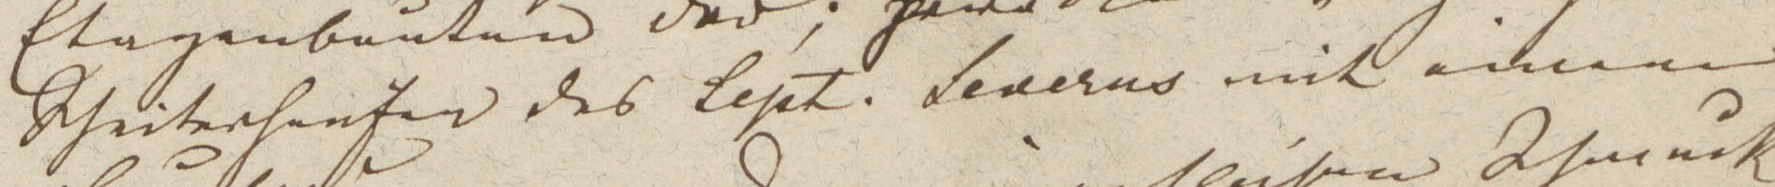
Scheiterhaufen des Sept. Severus mit einem
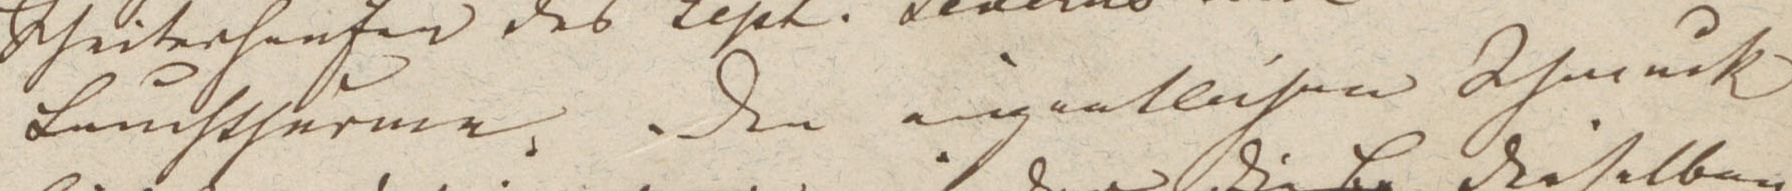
Leuchtthurme. Den eigentlichen Schmuck
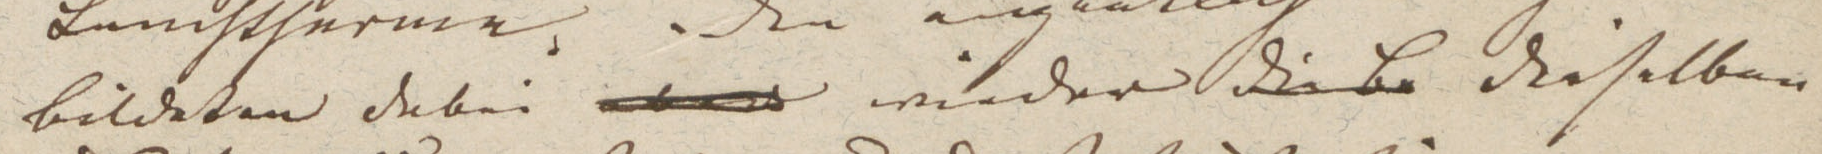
bildeten dabei aber wieder die B dieselben
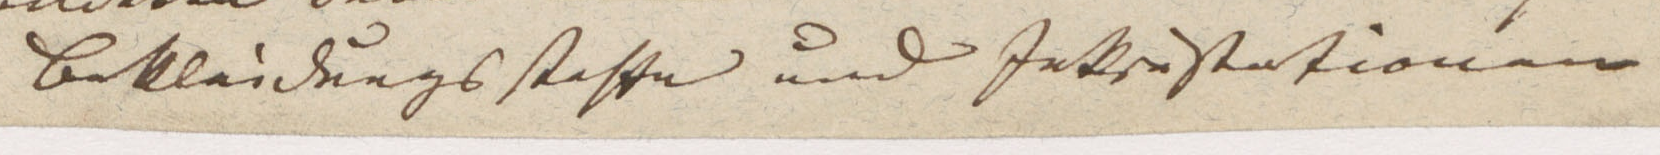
Bekleidungsstoffe und Inkrustationen
